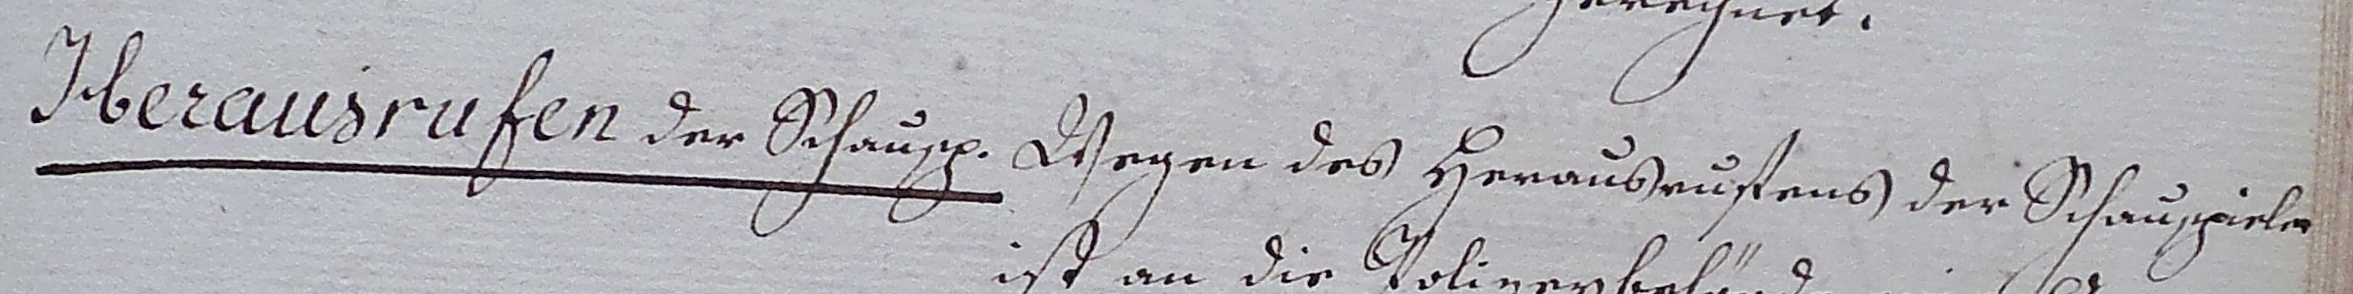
Herausrufen der Schausp. Wegen des Herausrufens der Schauspieler
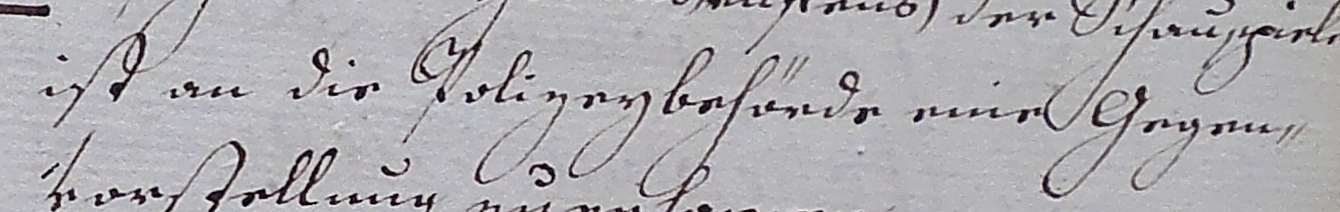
ist an die Polizeybehörde eine Gegen¬
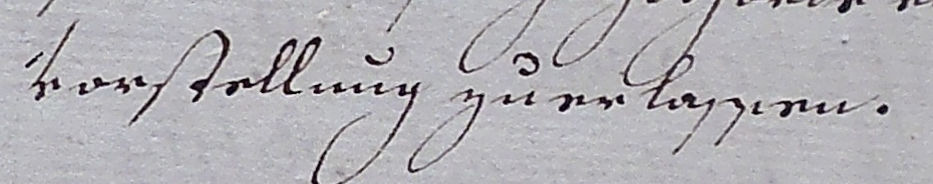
vorstellung zuerlassen.
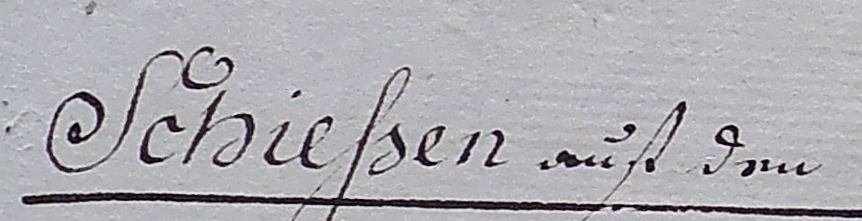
Schiessen auf den
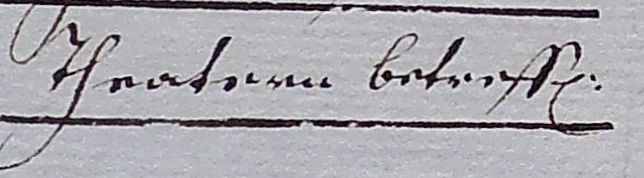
Theatern betreff:
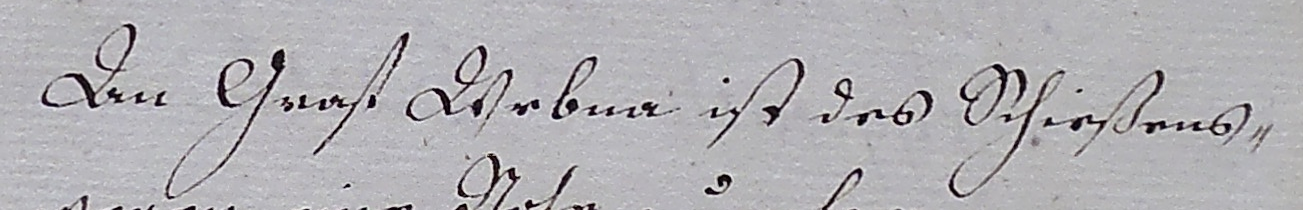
An Graf Wrbna ist des Schießens,
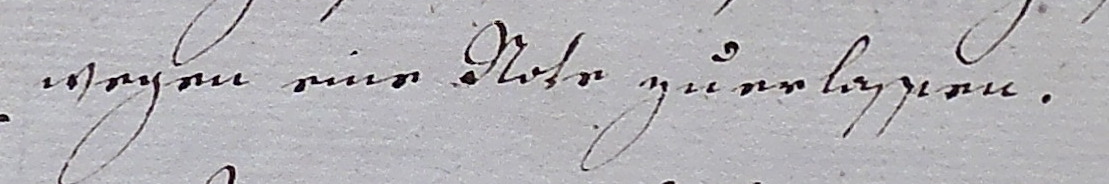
wegen eine Note zuerlassen.
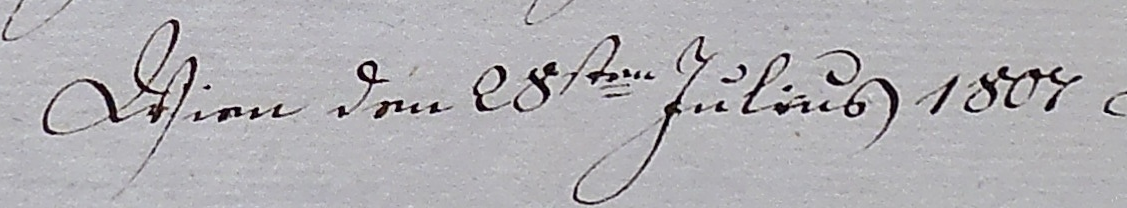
Wien den 28ste͇n Julius 1807.
